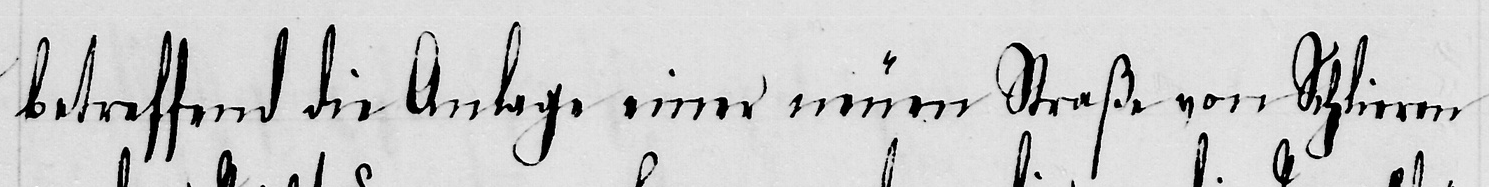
betreffend die Anlage einer neuen Straße von Schlieren
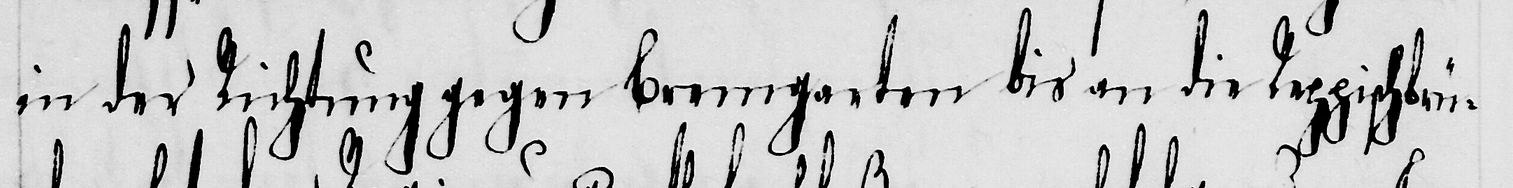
in der Richtung gegen Bremgarten bis an die Reppis¬
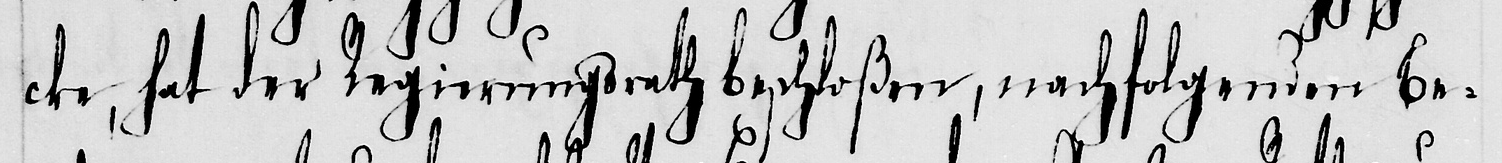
ücke, hat der Regierungsrath beschloßen, nachfolgenden Be¬
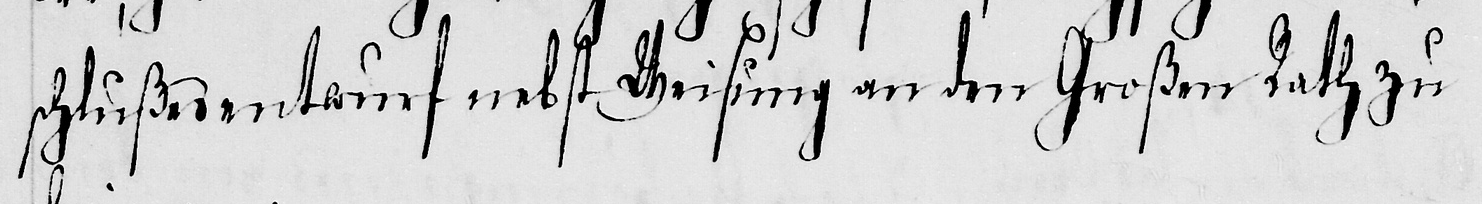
schlußesentwurf nebst Weisung an den Großen Rath zu
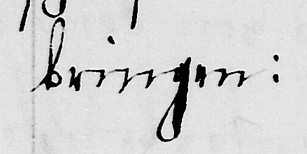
bringen:
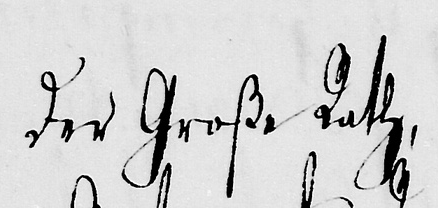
Der Große Rath,
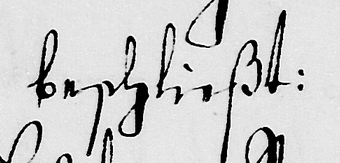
beschließt:
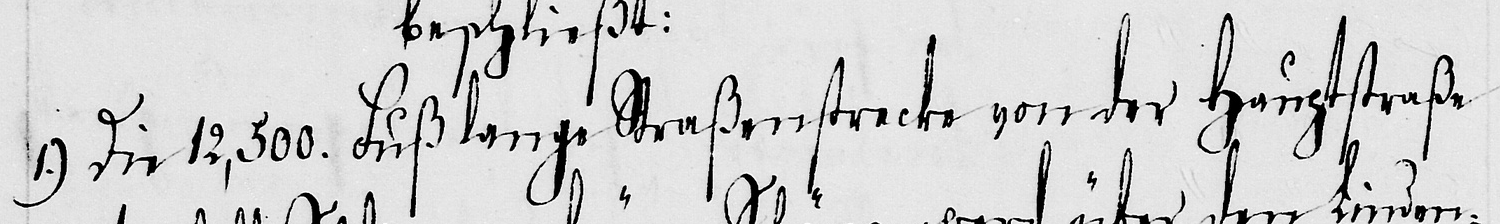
1.) Die 12,500. Fuß lange Straßenstrecke von der Hauptstraße
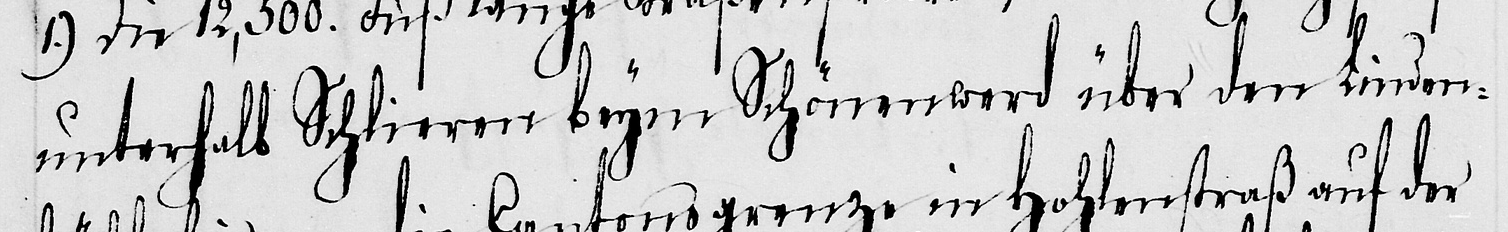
unterhalb Schlieren beym Schönenwerd über den Linden¬
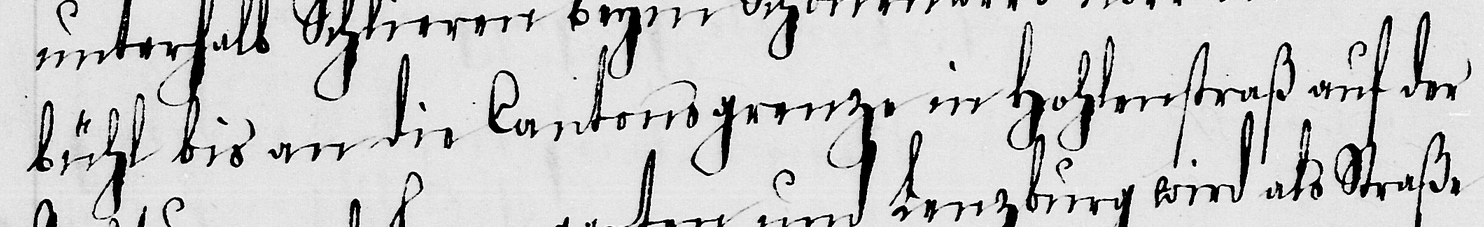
bühl bis an die Cantonsgrenze in Hohlenstraß auf der
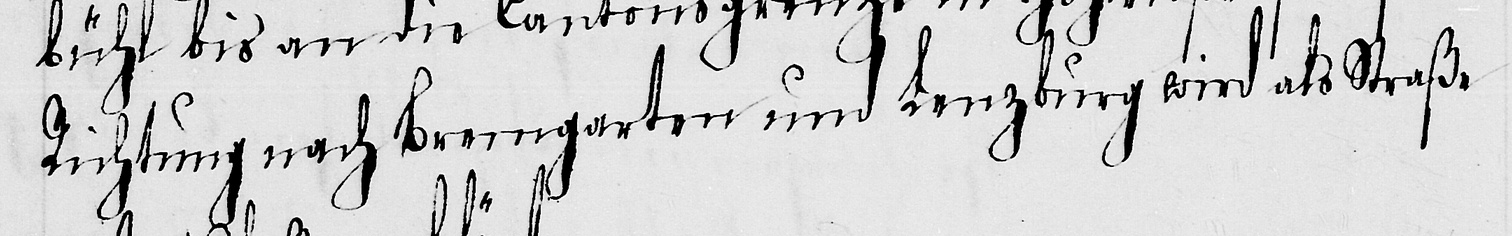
Richtung nach Bremgarten und Lenzburg wird als Straße
